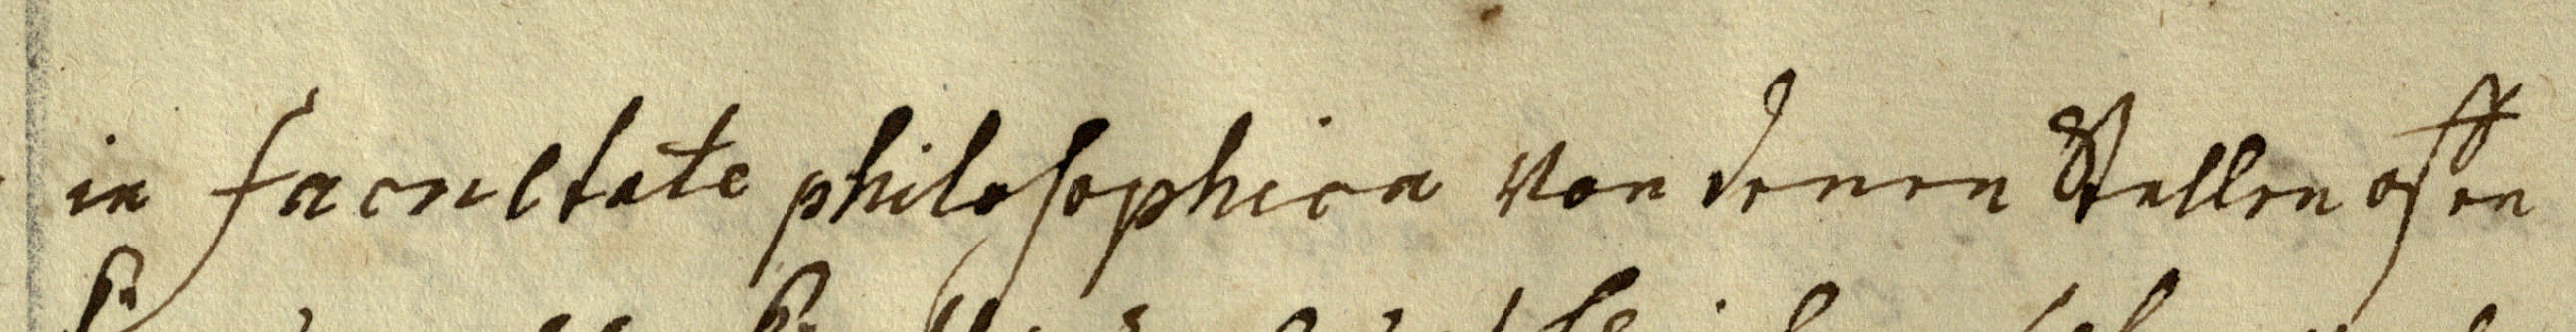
in Facultate philosophica von denen Stellen offen
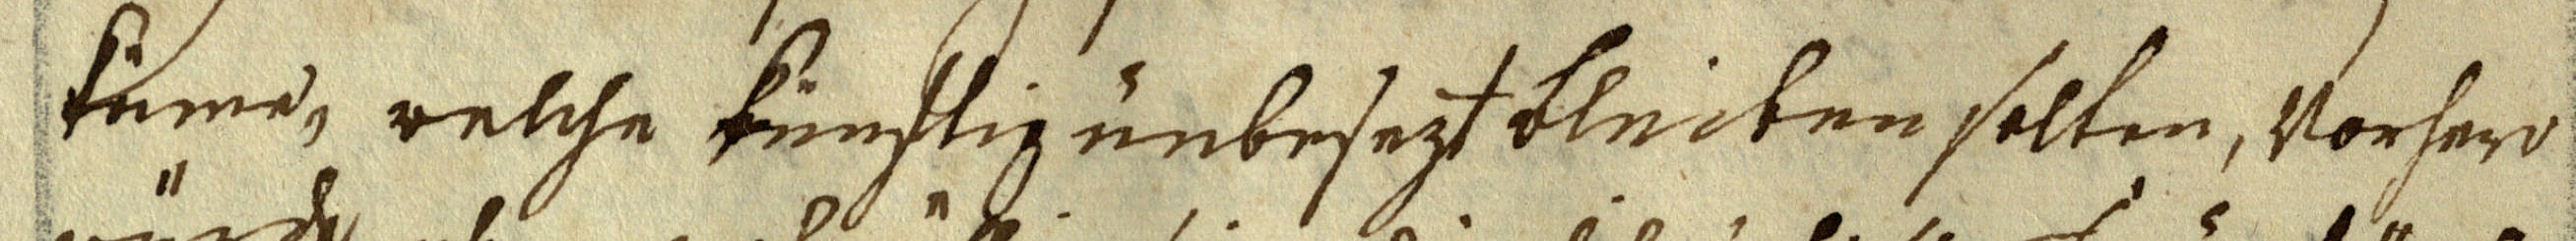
käme, welche künftig unbesezt bleiben solten, vorher
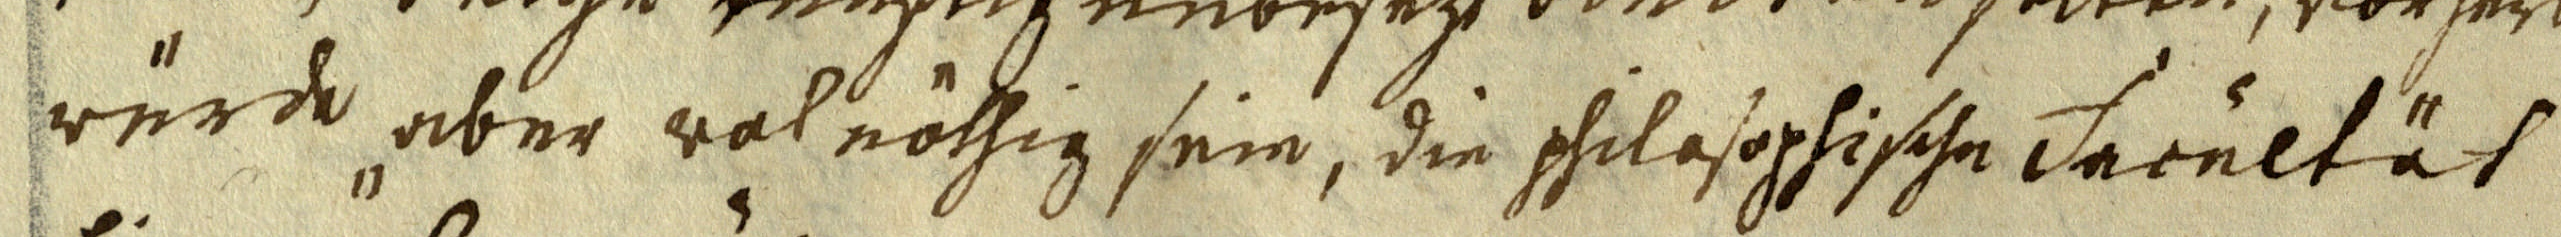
würde aber wol nöthig sein, die philosophische Facultät
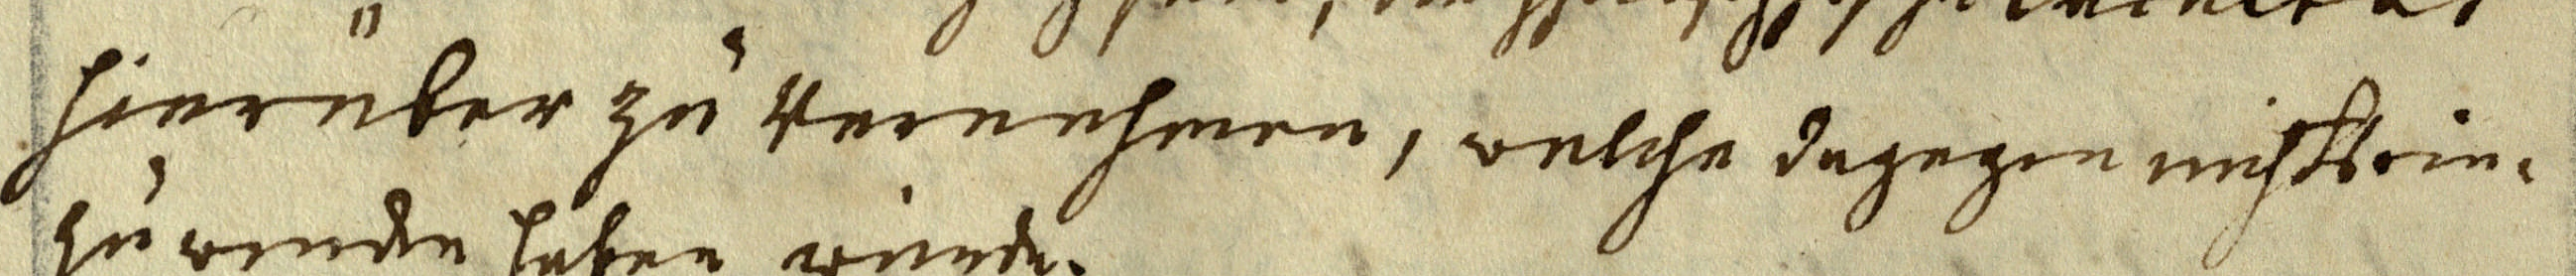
hierüber zu vernehmen, welche dagegennichts ein¬
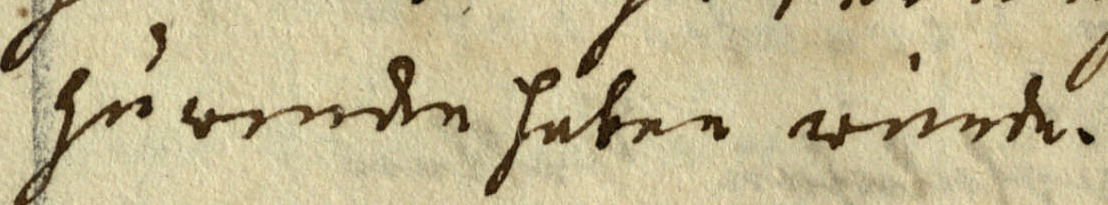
zuwenden haben würde.
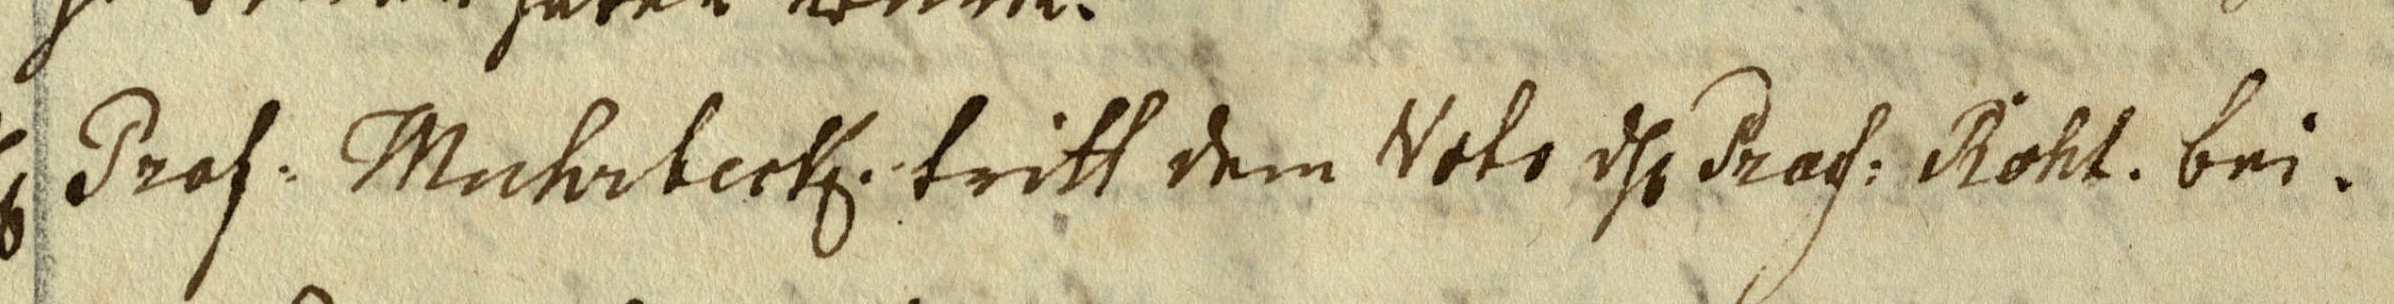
dh Prof. Muhrbeck. tritt dem Voto dh Prof. Röhl bei.
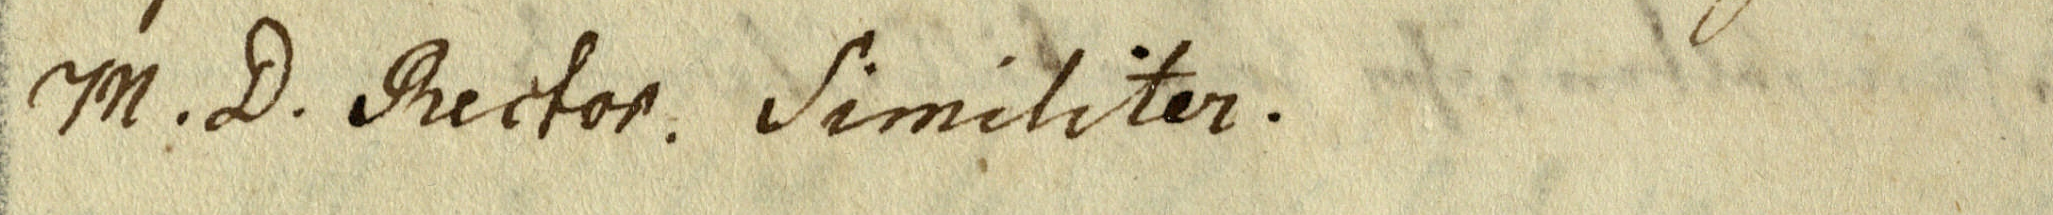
M. D. Rector. Similiter.
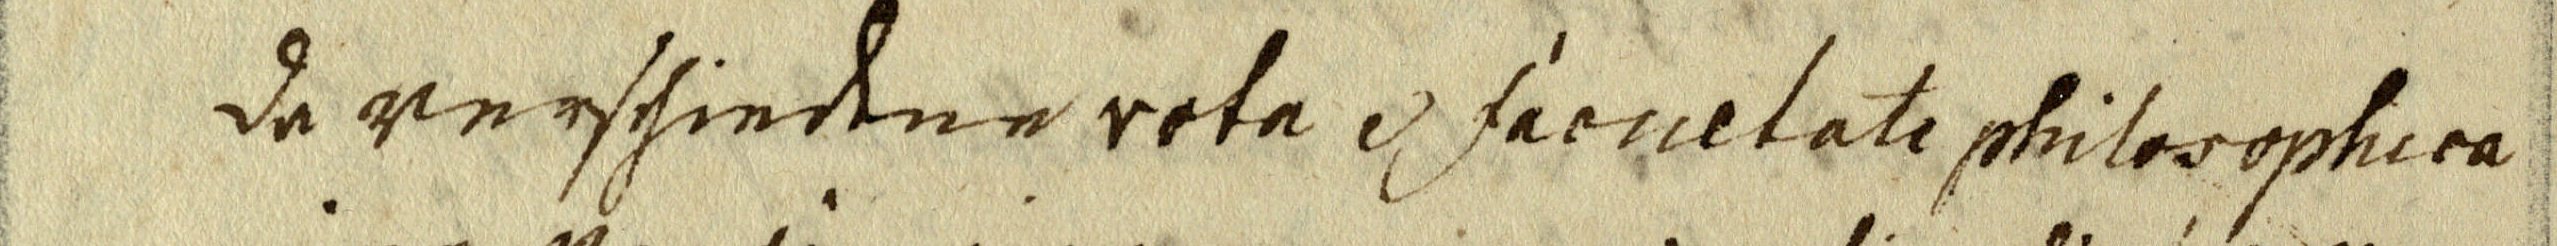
Da verschiedene vota a Facultate philosophica
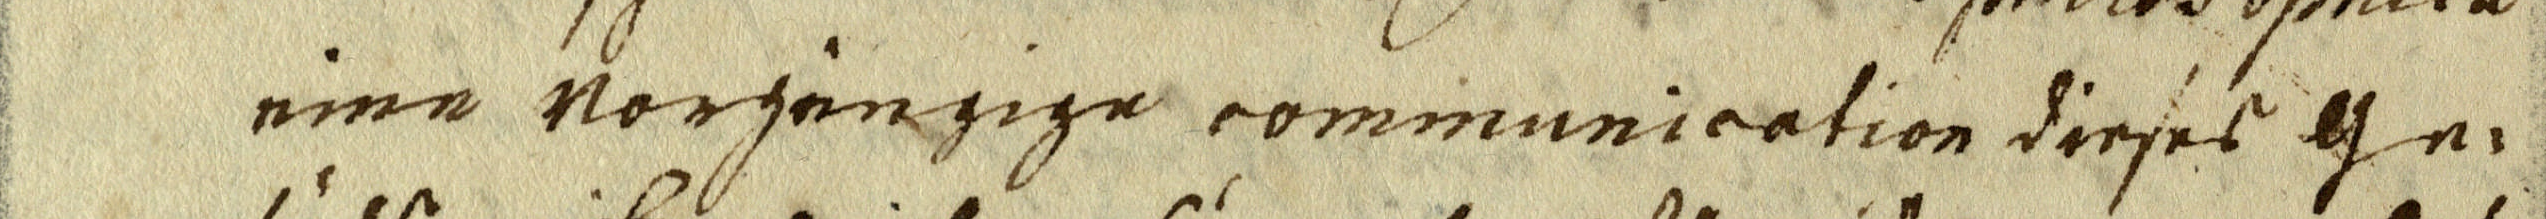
eine vorgängige communication dieses Ge¬
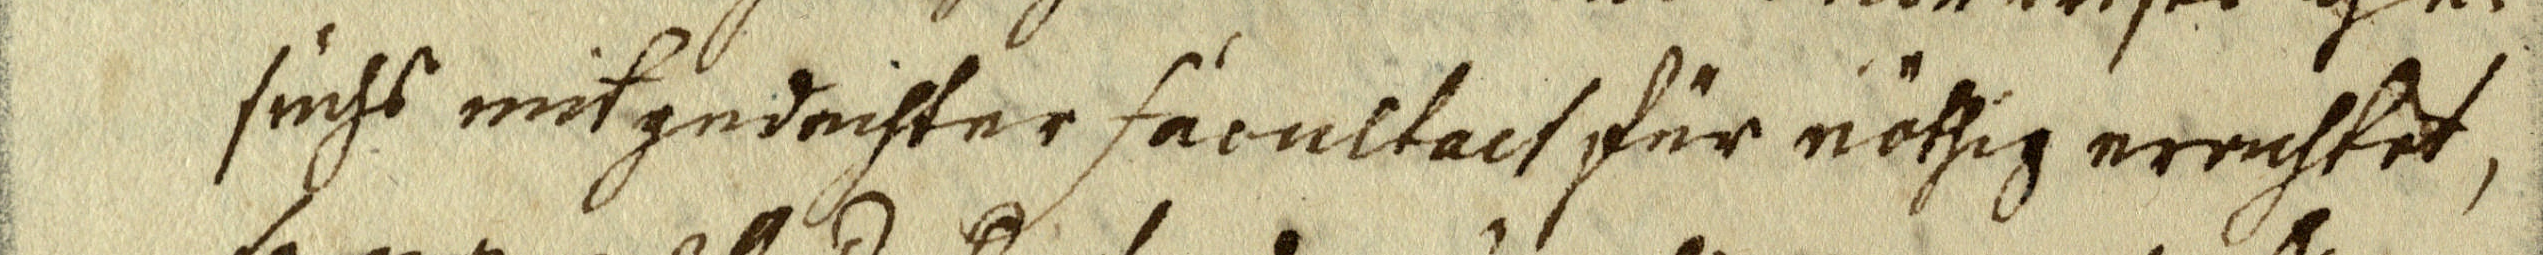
suchs mit gedachter Facultaet für nöthig erachtet,
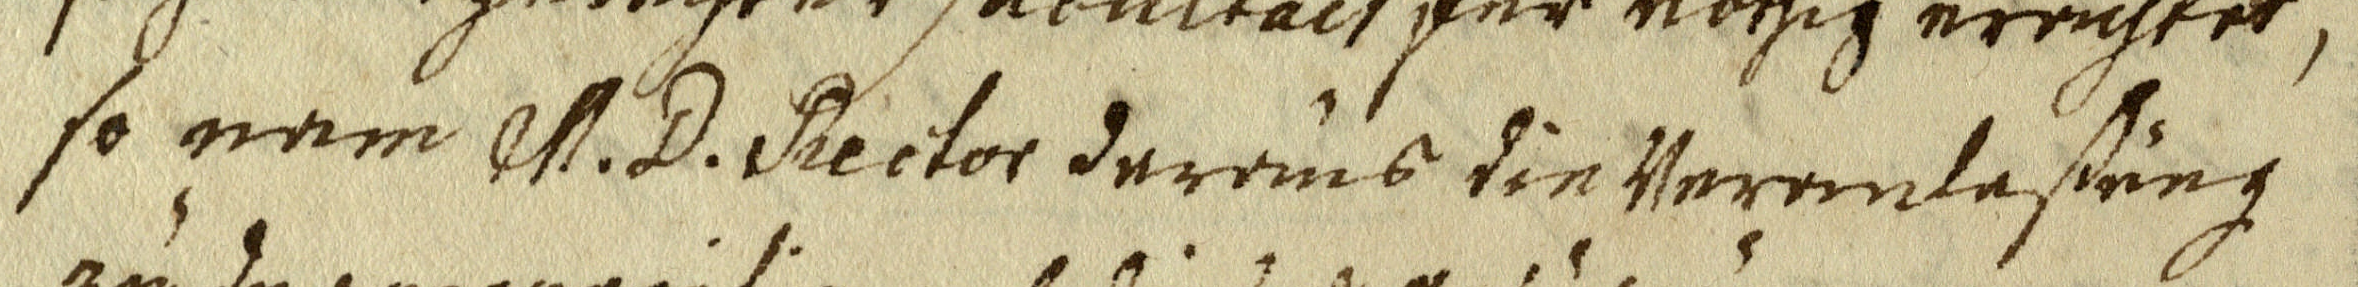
so nam M. D. Rector daraus die Veranlaßung
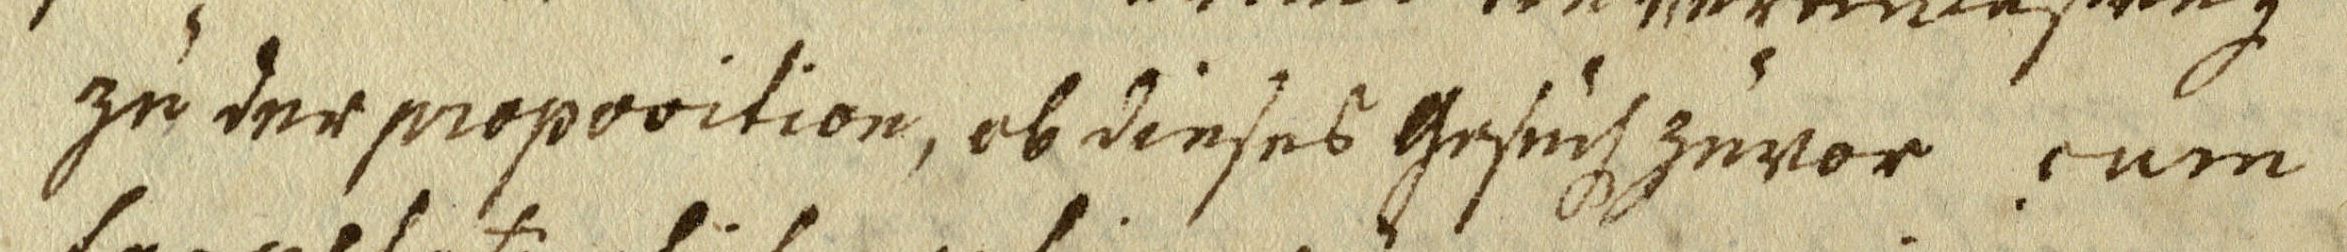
zu der proposition, ob dieses Gesuch zuvor cum
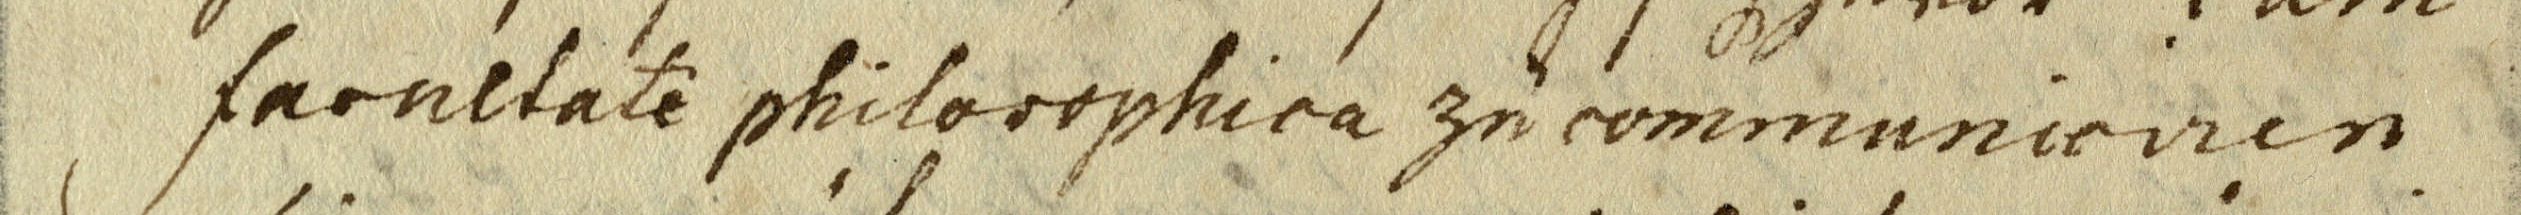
Facultate philosophica zu communiciren
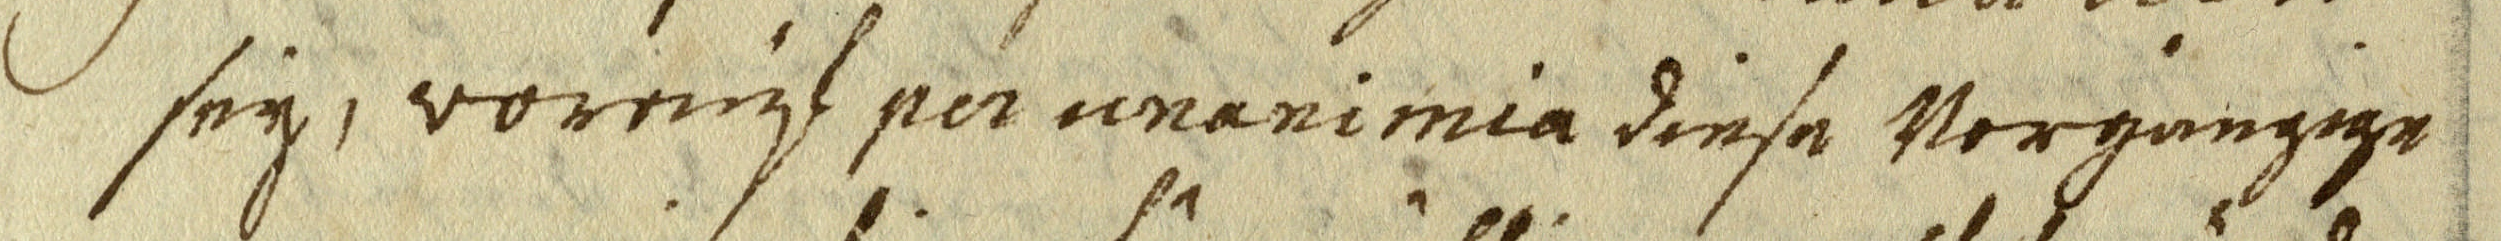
seÿ, worauf per unanimia diese vorgängige
